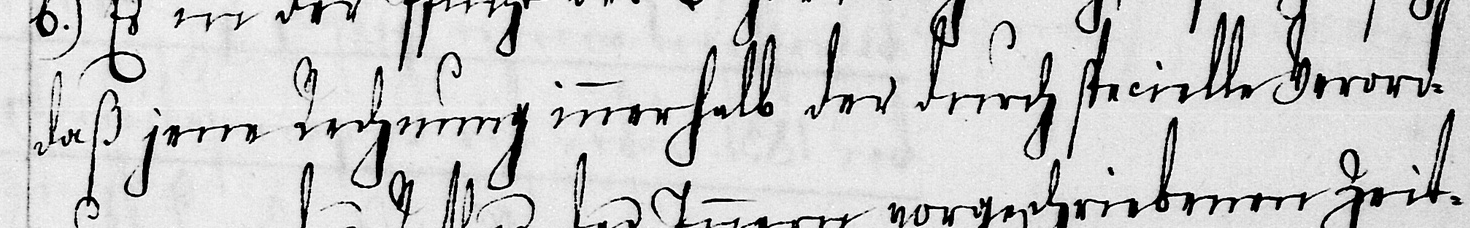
daß jene Rechnung innerhalb der durch specielle Verord¬
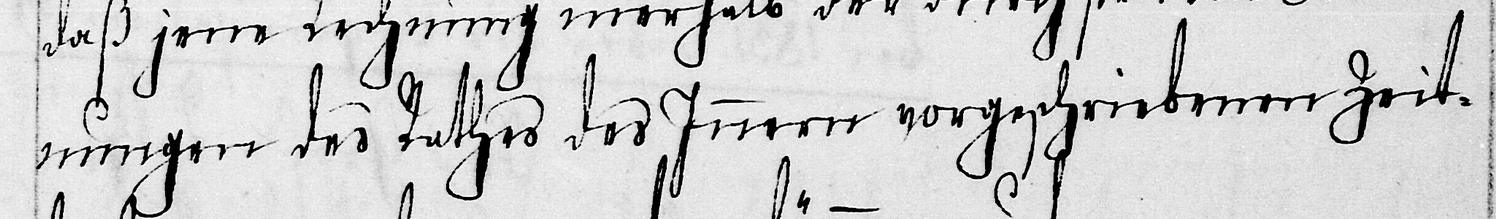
nungen des Rathes des Innern vorgeschriebenen Zeit¬
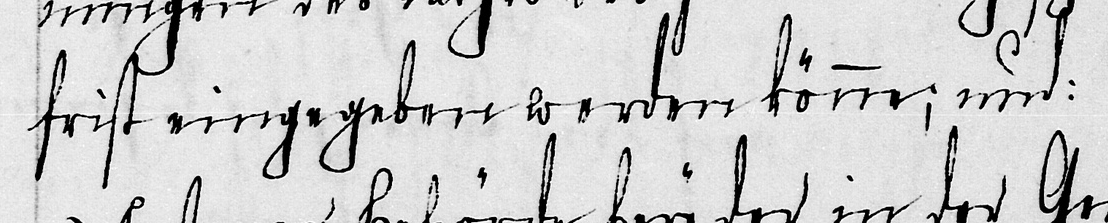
frist eingegeben werden könne; und:
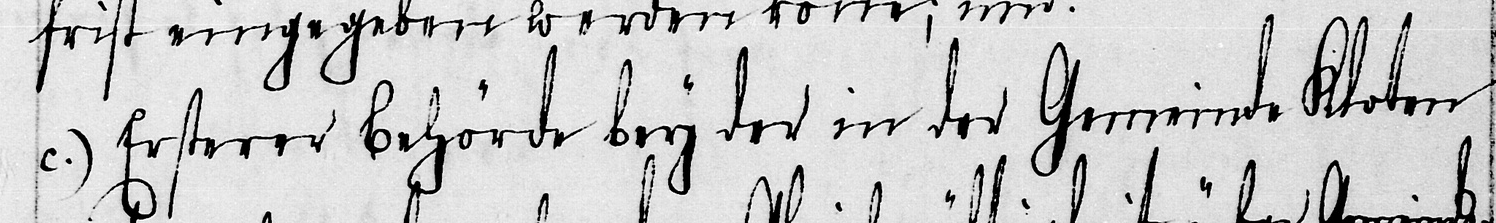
c.) Ersterer Behörde bey der in der Gemeinde Kloten
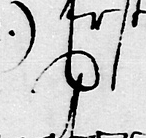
b.)
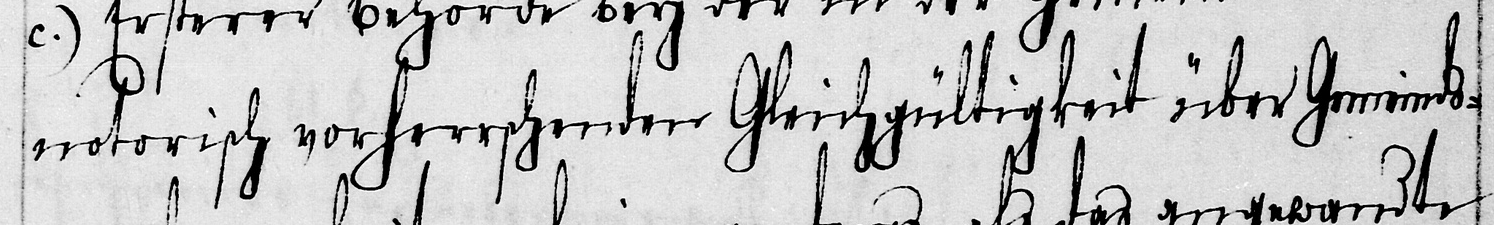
notorisch vorherrschenden Gleichgültigkeit über Gemeind¬
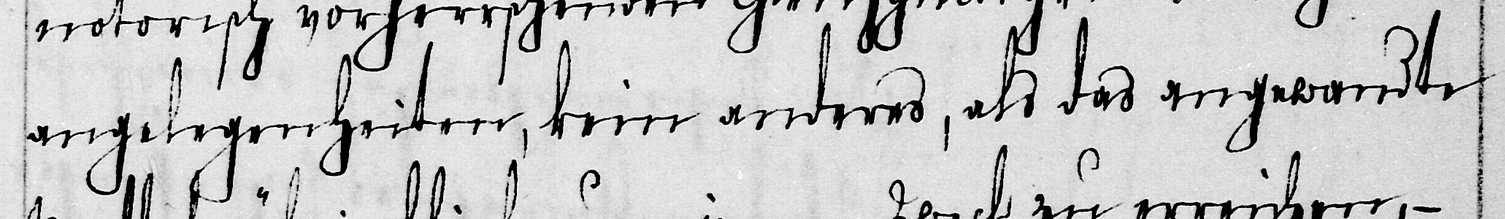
sangelegenheiten, kein anderes, als das angewandte
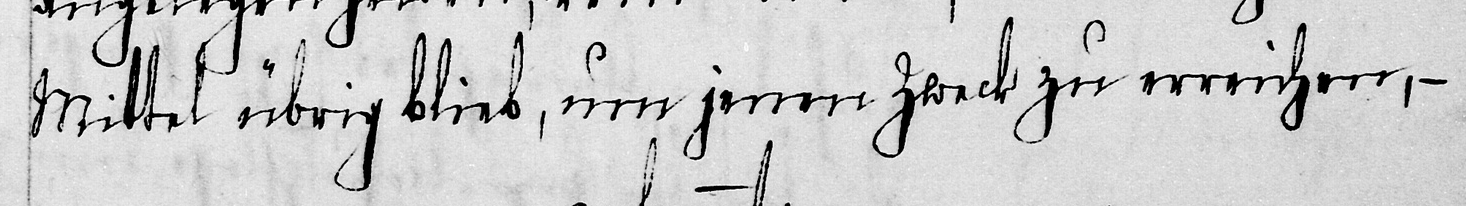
Mittel übrig blieb, um jenen Zweck zu erreichen, –
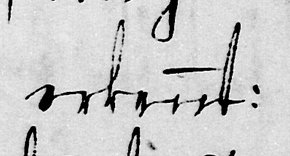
erkennt:
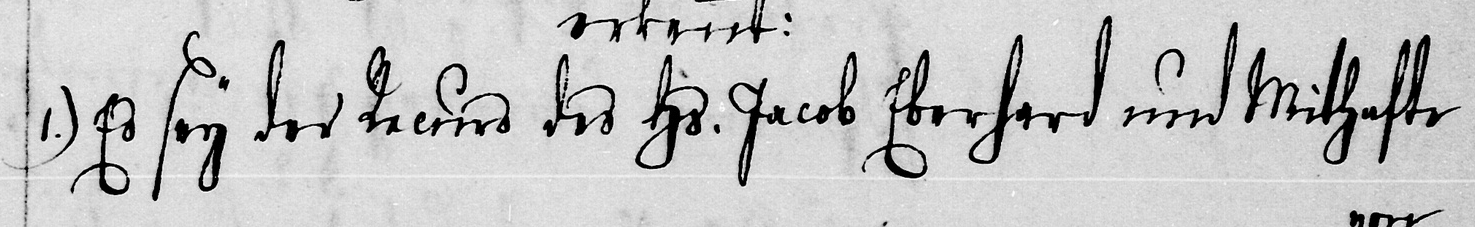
Es sey der Recurs des Hs. Jacob Eberhard und Mithafte
